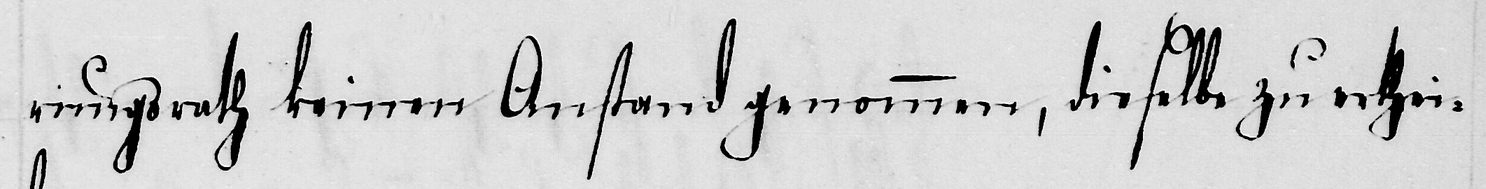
rungsrath, keinen Anstand genommen, dieselbe zu erthei¬
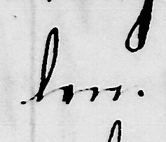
len.
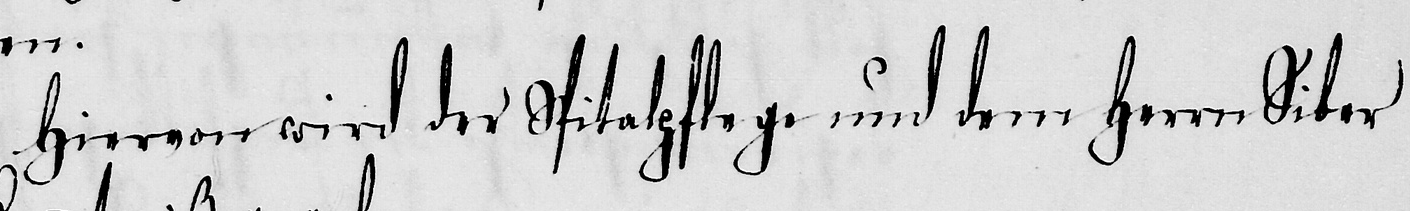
Hiervon wird der Spitalpflege und dem Herrn Siber
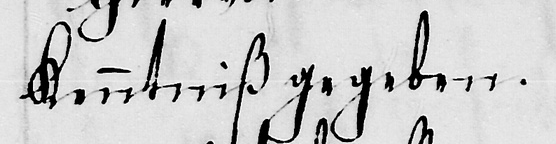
Kenntniß gegeben.
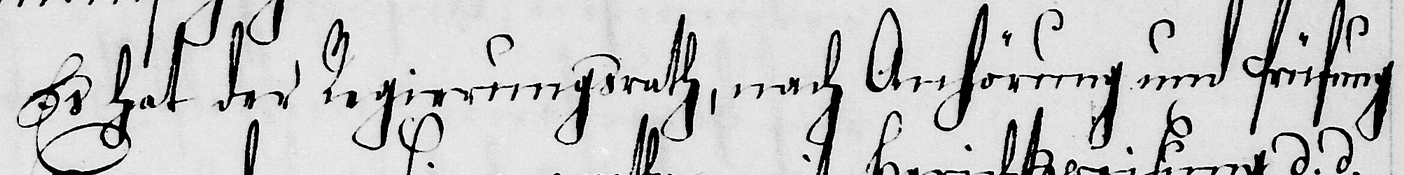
Es hat der Regierungsrath, nach Anhörung und Prüfung
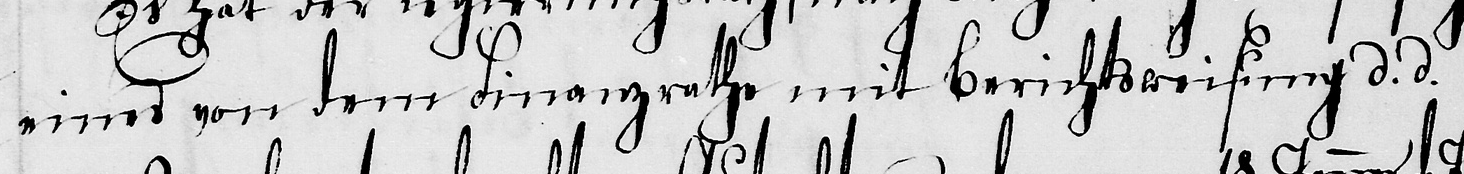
eines von dem Finanzrathe mit Berichtsweisung d. d.
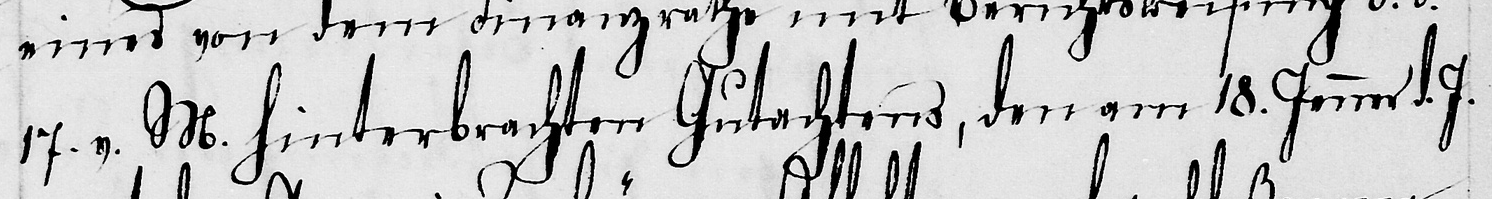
17. v. M. hinterbrachten Gutachtens, den am 18. Jenner d.
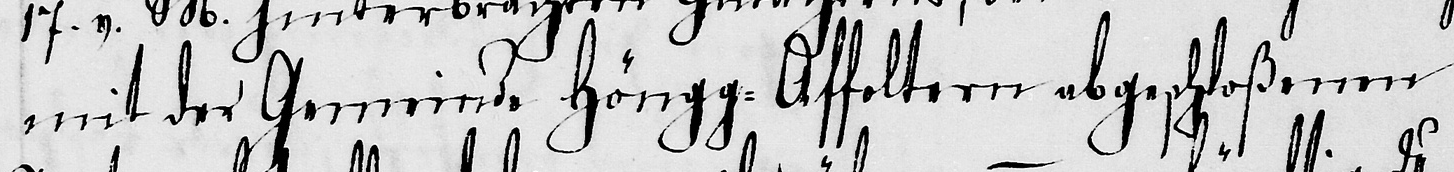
mit der Gemeinde Höngg-Affoltern abgeschloßenen
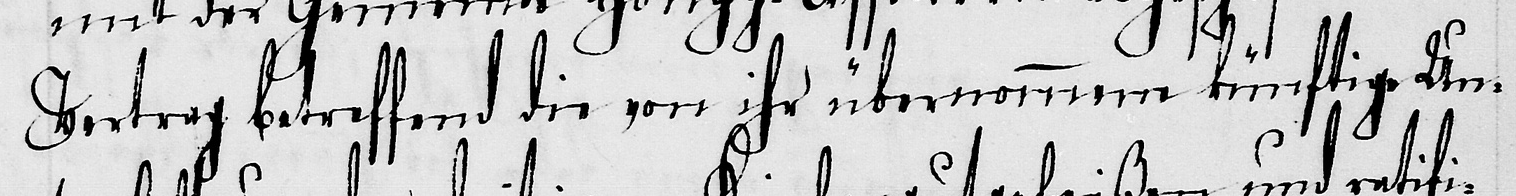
Vertrag betreffend die von ihr übernommene künftige Un¬
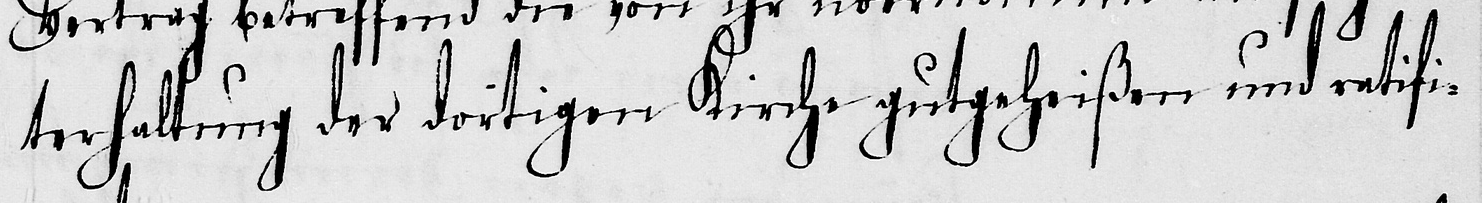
terhaltung der dortigen Kirche gutgeheißen und ratifi¬
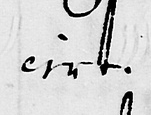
cirt.
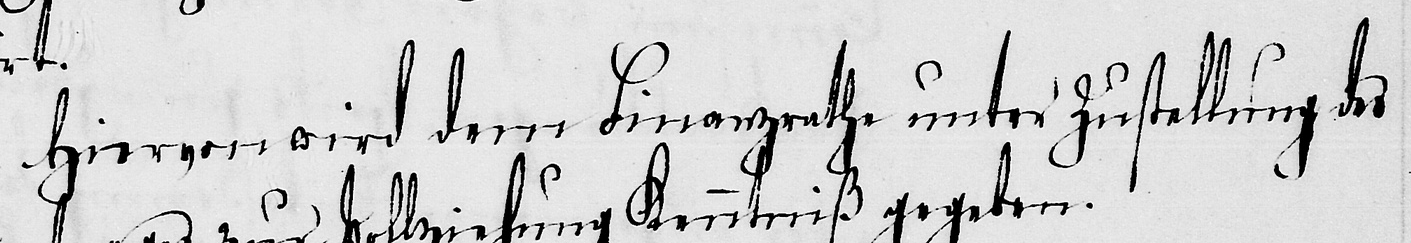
Hiervon wird dem Finanzrathe unter Zustellung des
